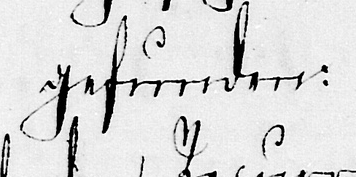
gefunden:
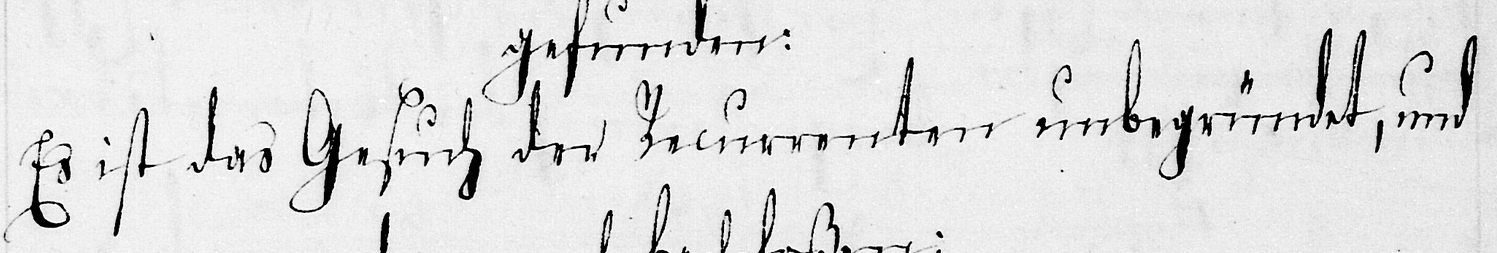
Es ist das Gesuch der Recurrenten unbegründet, und
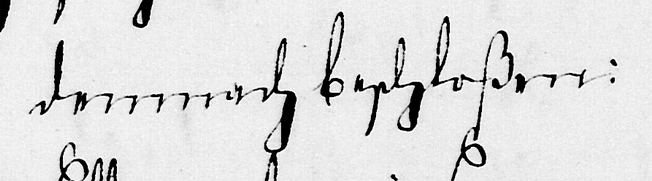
demnach beschloßen:
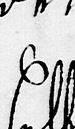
1.)
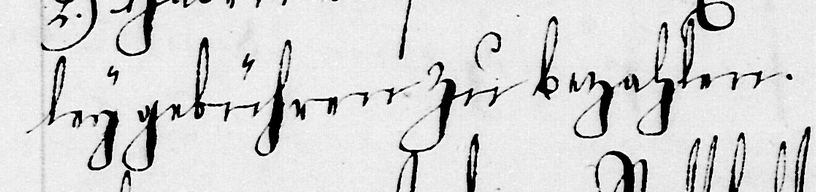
zleygebühren zu bezahlen.
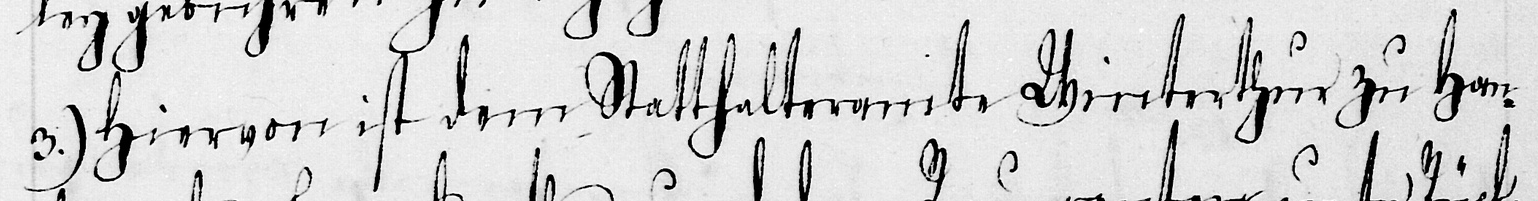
3.) Hiervon ist dem Statthalteramte Winterthur zu Han¬
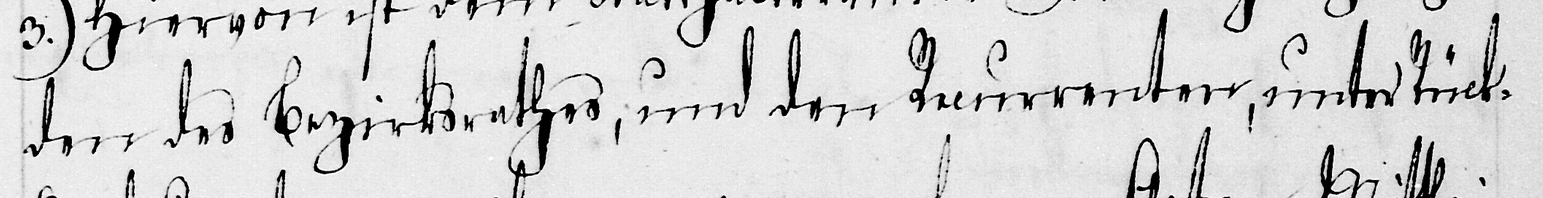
den des Bezirksrathes, und den Recurrenten, unter Rück¬
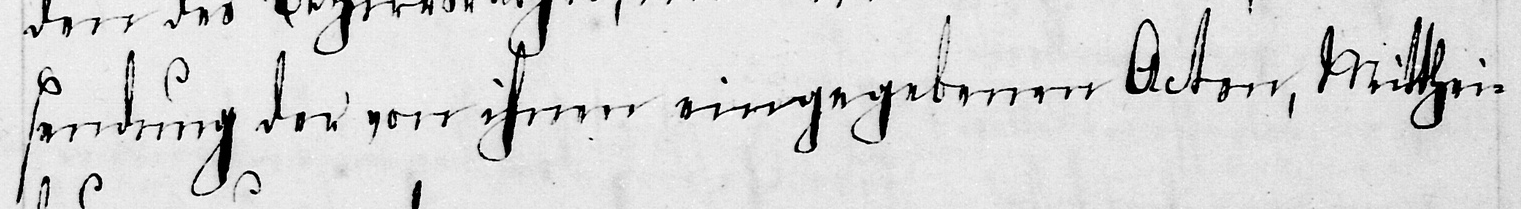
sendung der von ihnen eingegebenen Acten, Mitthei¬
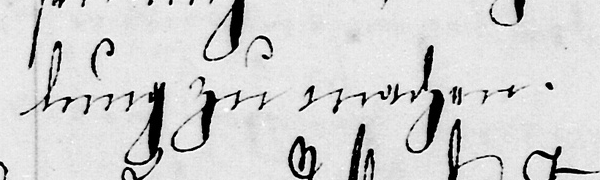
lung zu machen.
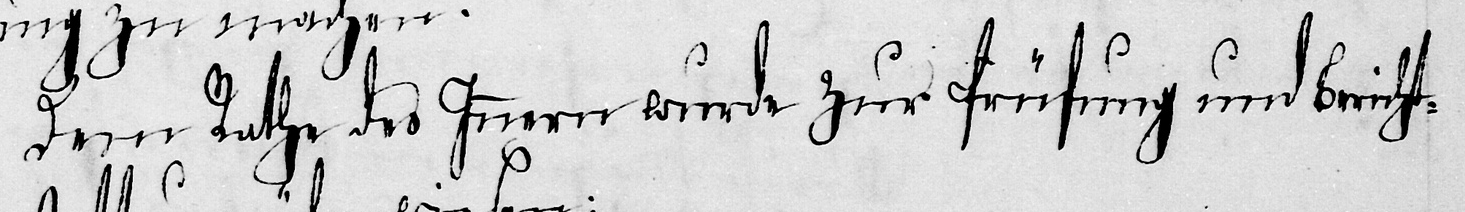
Dem Rathe des Innern wurde zur Prüfung und Begut¬
